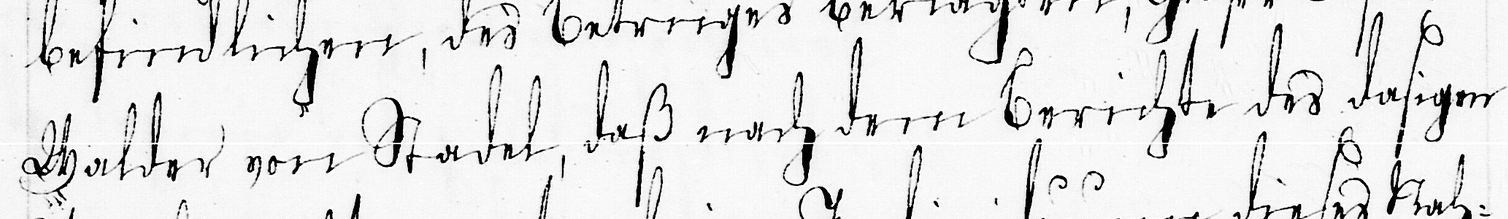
Walder von Stadel, daß nach dem Berichte des dasigen
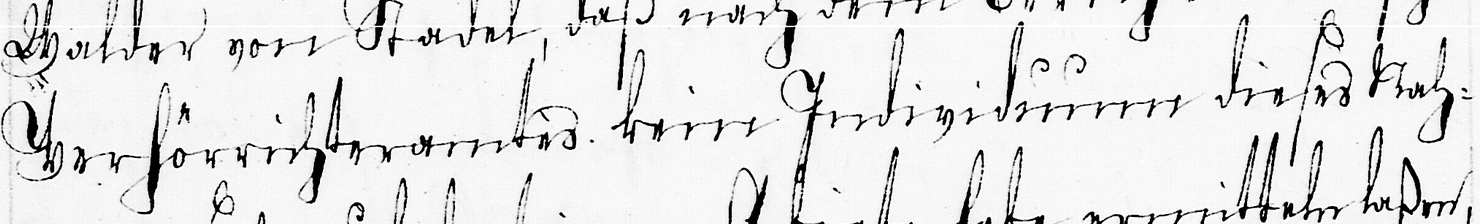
Verhörrichteramtes kein Individuum dieses Nah¬
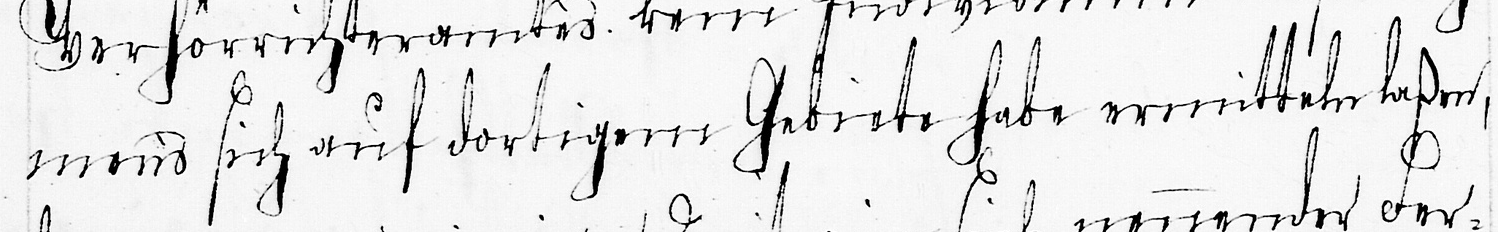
mens sich auf dortigem Gebiete habe ermitteln laßen,
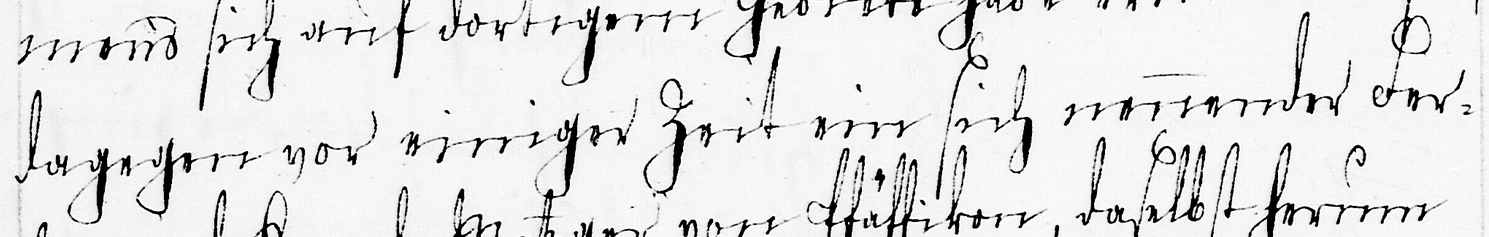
dagegen vor einiger Zeit ein sich nennender Fer¬
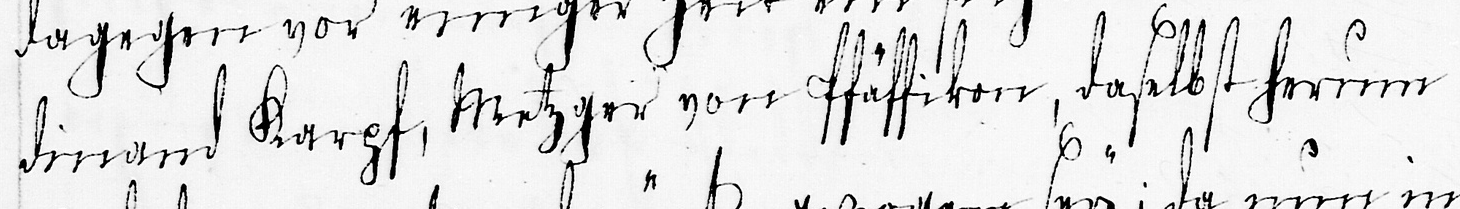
dinand Karpf, Metzger von Pfäffikon, daselbst herum
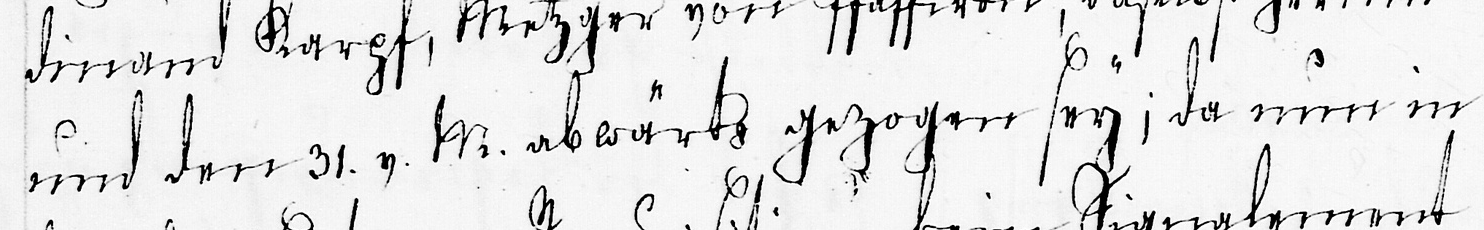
und den 31. v. M. abwärts gezogen sey; da nun in
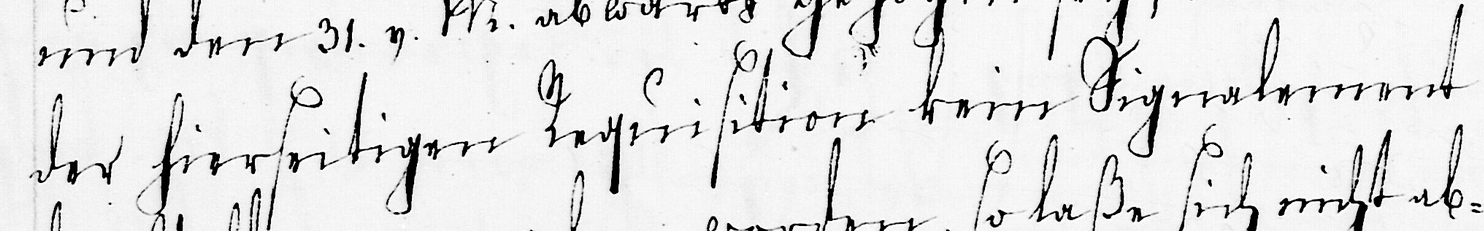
der hierseitigen Requisition kein Signalement
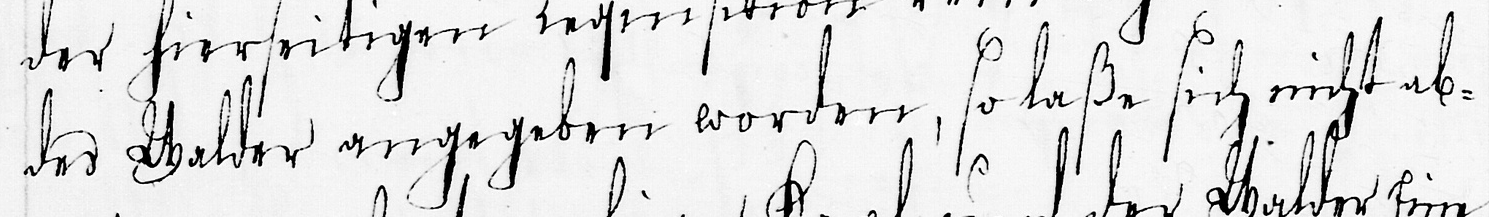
des Walder angegeben worden, so laße sich nicht ab¬
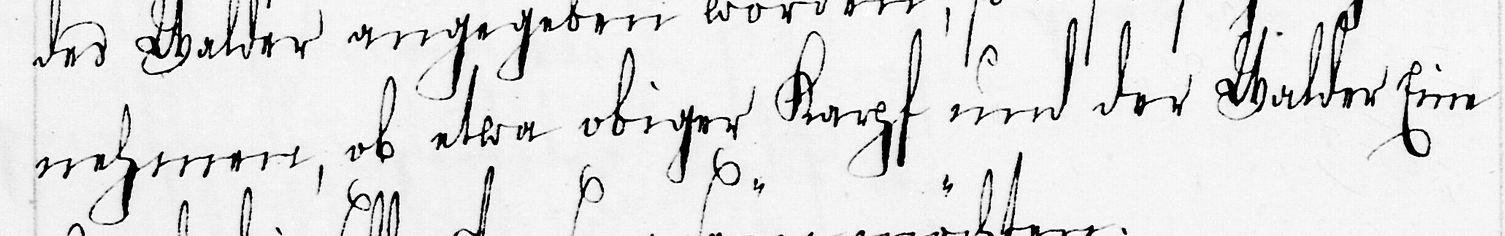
nehmen, ob etwa obiger Karpf und der Walder Eine
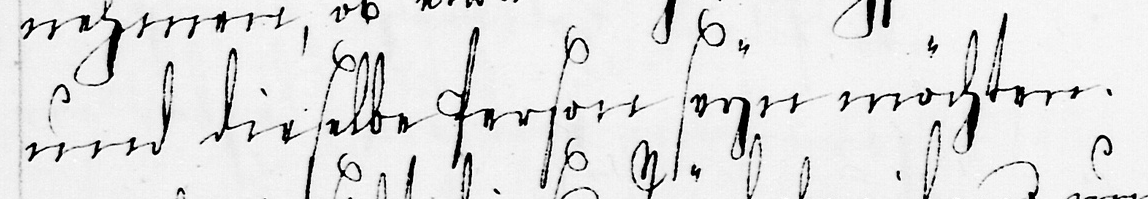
und dieselbe Person seyn möchten.
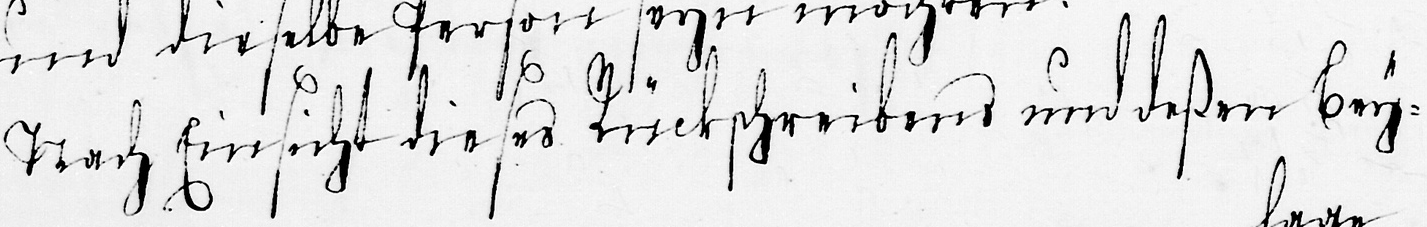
Nach Einsicht dieses Rückschreibens und deßen Bey-
